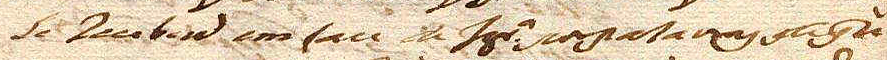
se Recebeu em face de Jgr.a por palavras de pRe
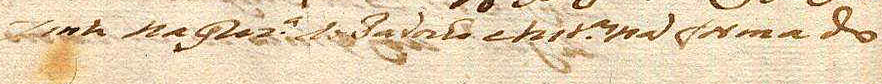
zente na pRez.a do Parocho e test.as na forma do
